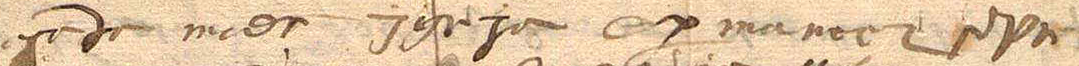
a sāta madre JgreJa e ꝑmaneçer sēpre
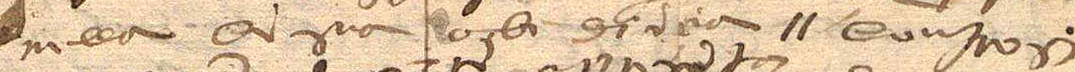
nella e ē sua obediēçia // e outrosj
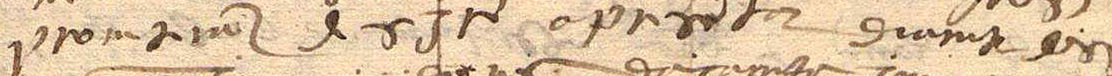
prometeraõ de se Jrē apresētar diamte dos
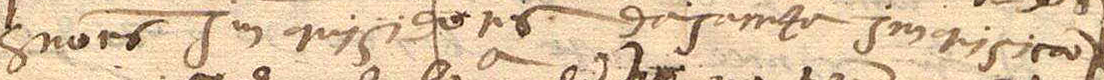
snors̄ Jmqujsidores da samta Jmqujsiçaõ
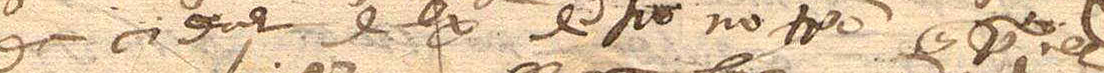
da cidade de lxa dētro no tpō q̄ p̄o ell
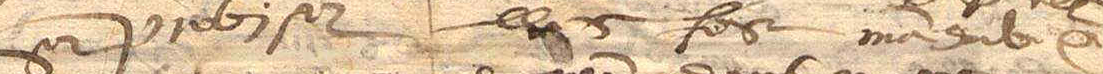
sor̄ provisor lhes fose mādado e
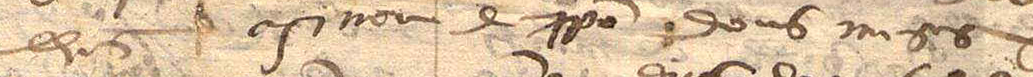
lhes asinou de tpō dous meses q̄
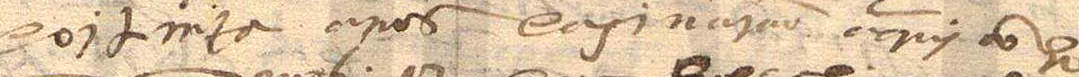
e ojtemta anos e asinaraõ aquj cō ho
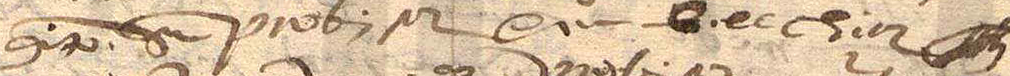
dit̄o sōr provisor e eu bellchior ffrz̄
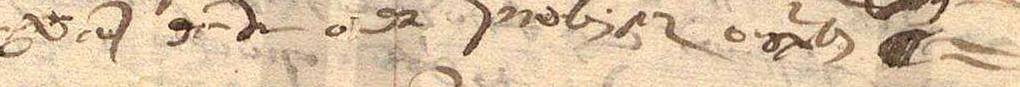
esp̄vaõ dāte o dito provisor o esp̄ivj
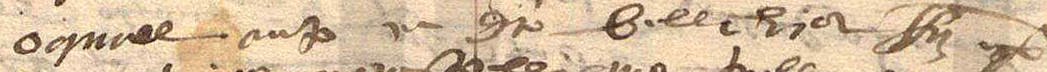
o quall auto eu dit̄o bellchior ffrz̄ esp̄ivaõ
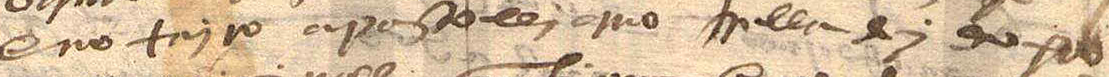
e notajro apostolljquo trelladej do pro
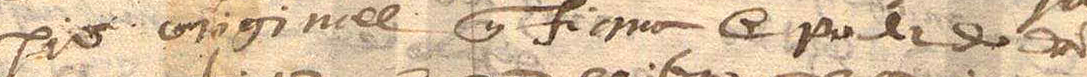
pio originall q̄ firma ē poder do ditō
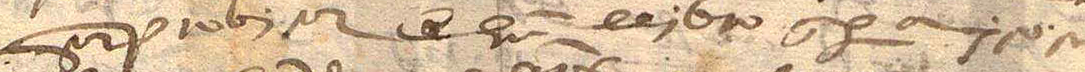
sor̄ provjsor ē hū lljvro q̄ ꝑa jso se
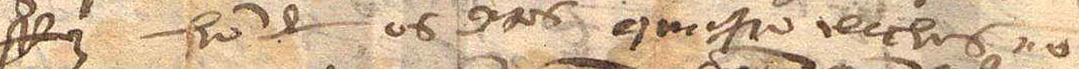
ffez hōde os dit̄os quatro ellches no
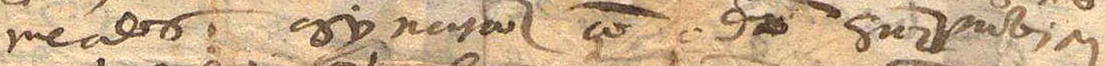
meados asynaraõ cō o dt̄o sor̄ provisor
